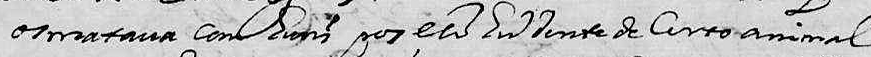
os mataua com huns̄ pos, e cō hū dente de certo animal
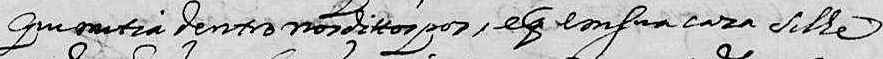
que metia dentro nos dittos pos, e q̄ em sua caza se lhe
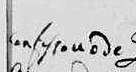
confessou o de
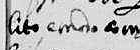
lito, e indo com
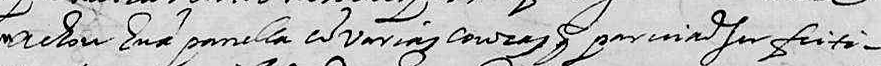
achou huā panella cō varias couzas q̄ pareciaõ ser feiti
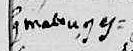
q̄ matou, os es
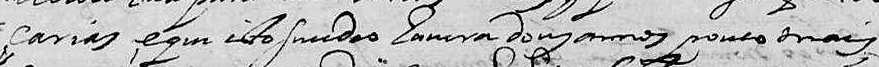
çarias, e que isto sucedeo hauera dous annos pouco mais
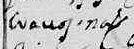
crauos e naõ
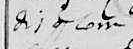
dis q̄ com
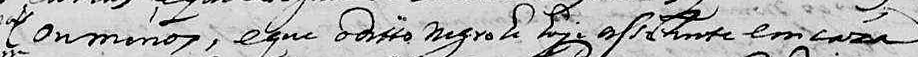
ou menos, e que o ditto negro he hoje assistente em caza
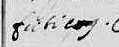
feitiços.
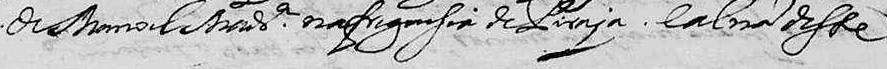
de Manoel Madr.a na freguesia de Piraja. e al nā disse
